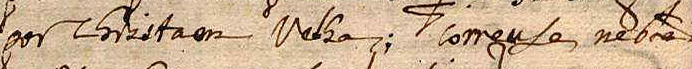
por Christam Velha; correuse nesta
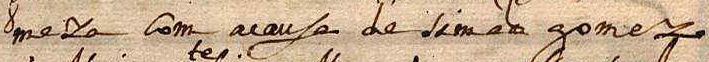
meza com a causa de simaõ gomez
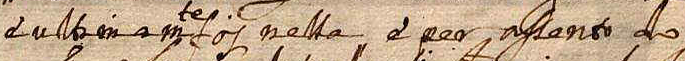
e ultimamte foj nella e per assento do
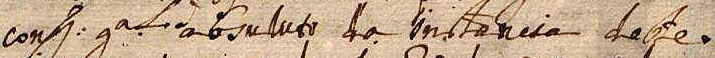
cons.o gaL. absuluto da Instancia deste
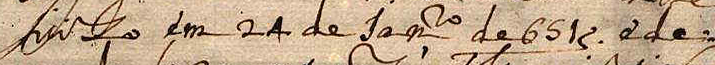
juizo em 24 de Ianro de 651. e de
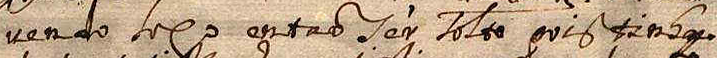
uendo logo entaõ ser solto pois tinha
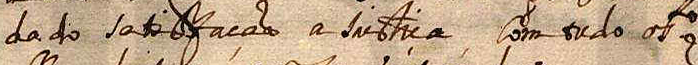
dado satisfaçaõ a Iustiça comtudo o sto.
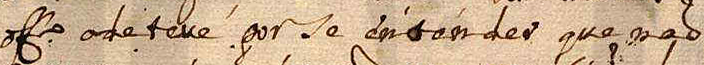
off.o o deteue por se entender que naõ
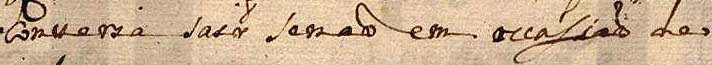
conueria sair senaõ em occasiaõ de
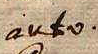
auto.
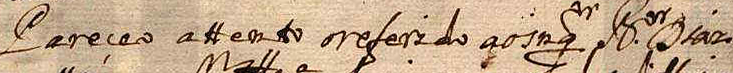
Pareçeo attento o referido ao inqor B.or Diaz
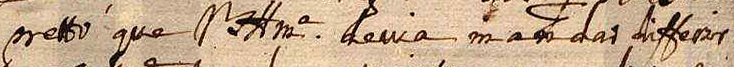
pretto que V Illma. deuia mandar differir
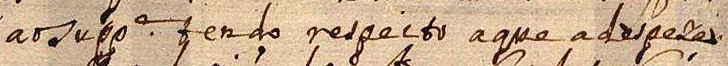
ao suppe. tendo respeito a que a despeza
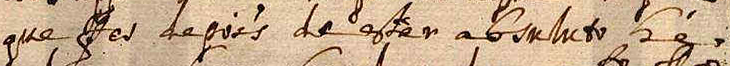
que fes depois de estar absuluto he
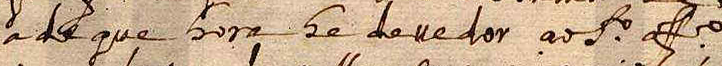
a de que hora he deuedor ao s.to off.o
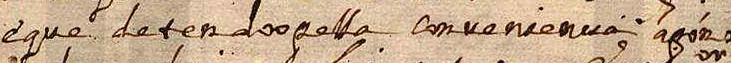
e que detendoo pella conueniencia apon
